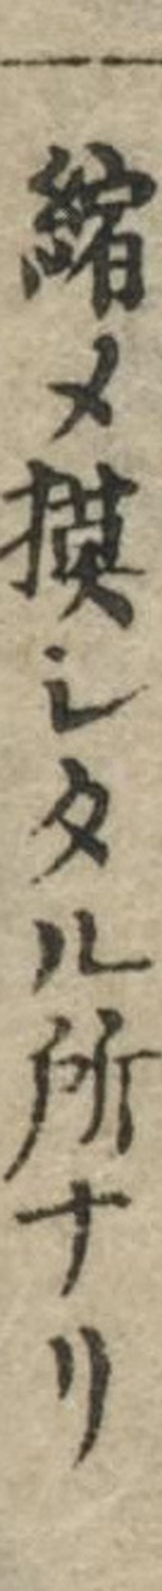縮メ模シタル所ナリ
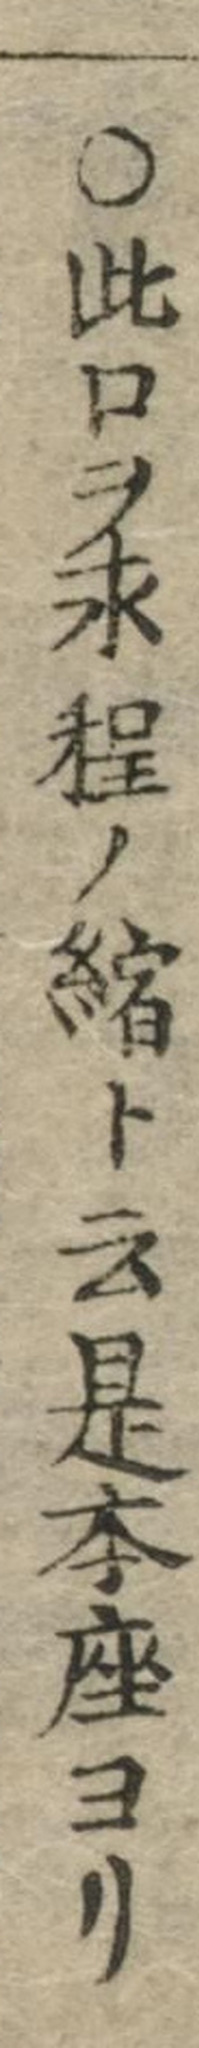○此口ヲ求程ノ縮ト云是本座ヨリ
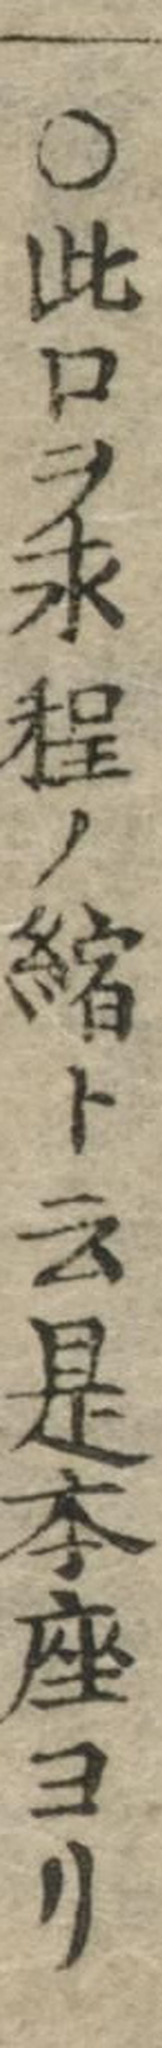○此口ヲ求程ノ縮ト云是本座ヨリ
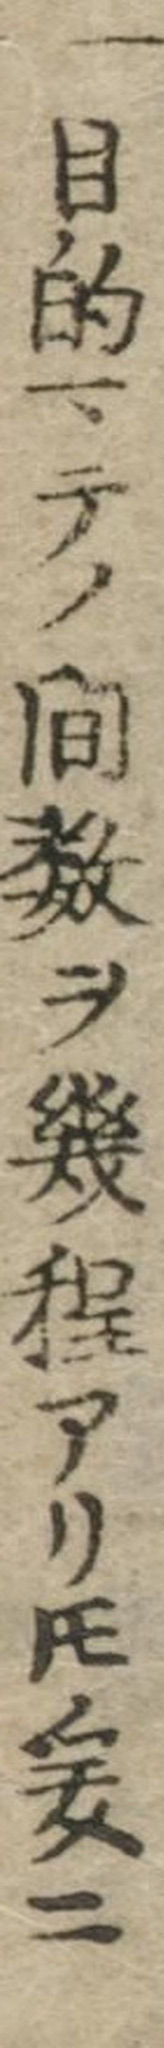目的マテノ間数ヲ幾程アリトモ爰ニ
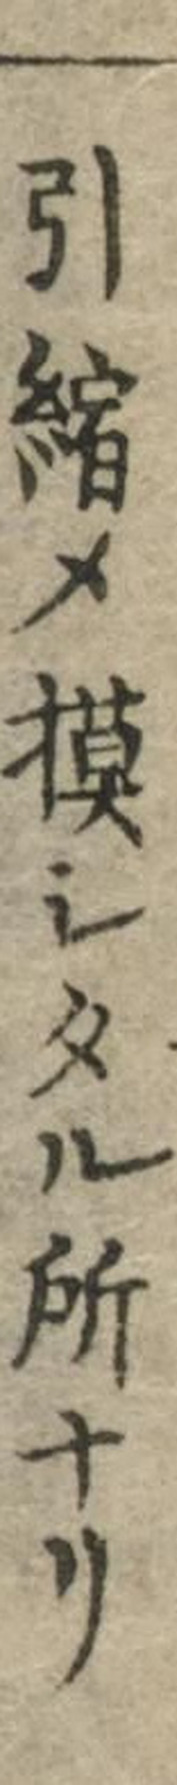引縮メ模シタル所ナリ
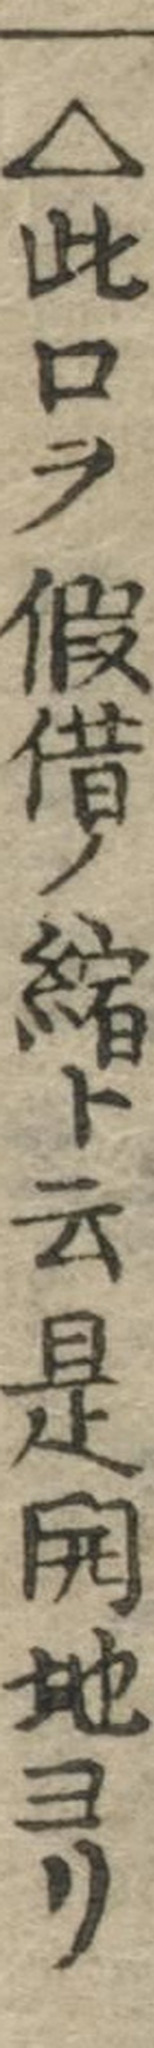△此口を仮借ノ縮ト云是開地ヨリ
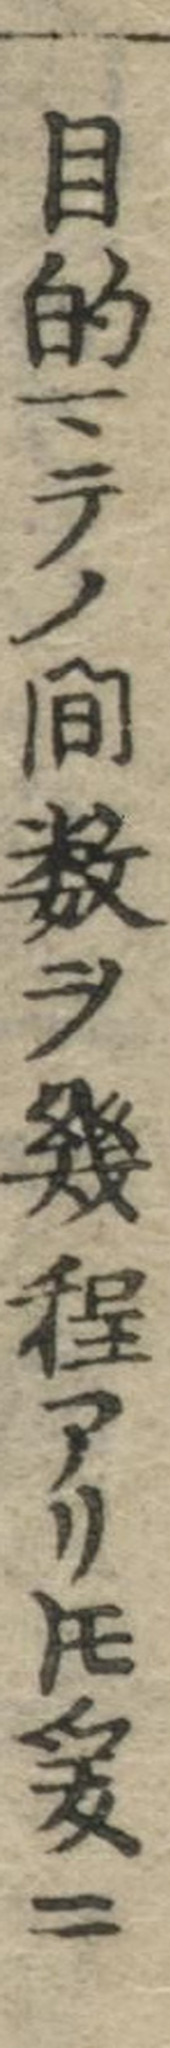目的マテノ間数ヲ幾程アリトモ爰ニ
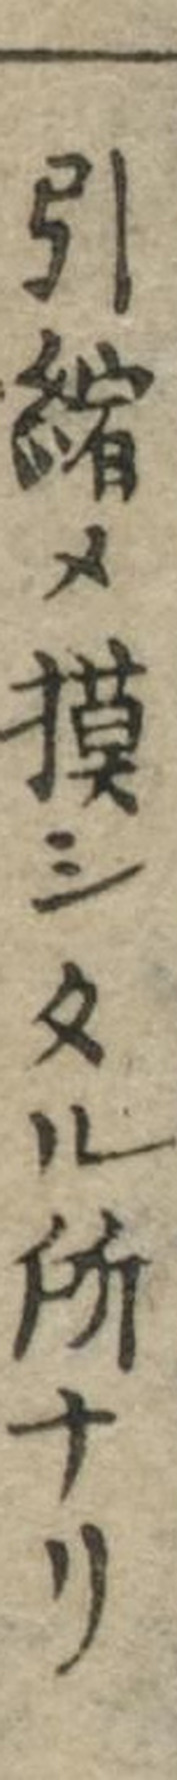引縮メ模シタル所ナリ
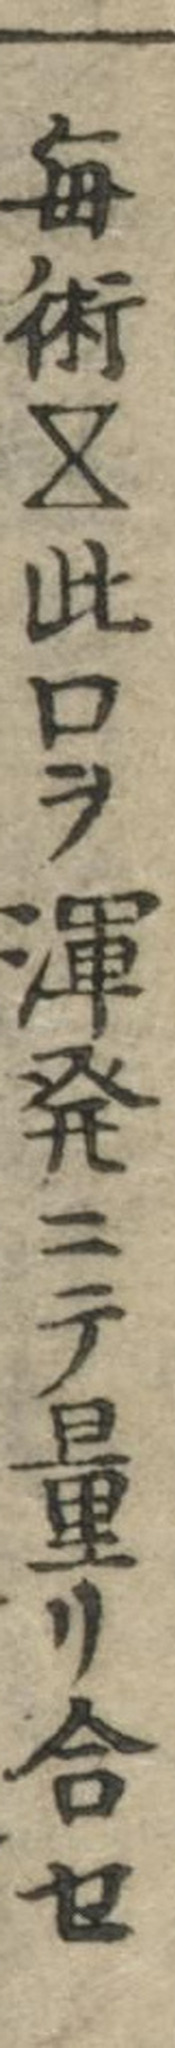毎術▽△此口ヲ渾発ニテ量リ合セ
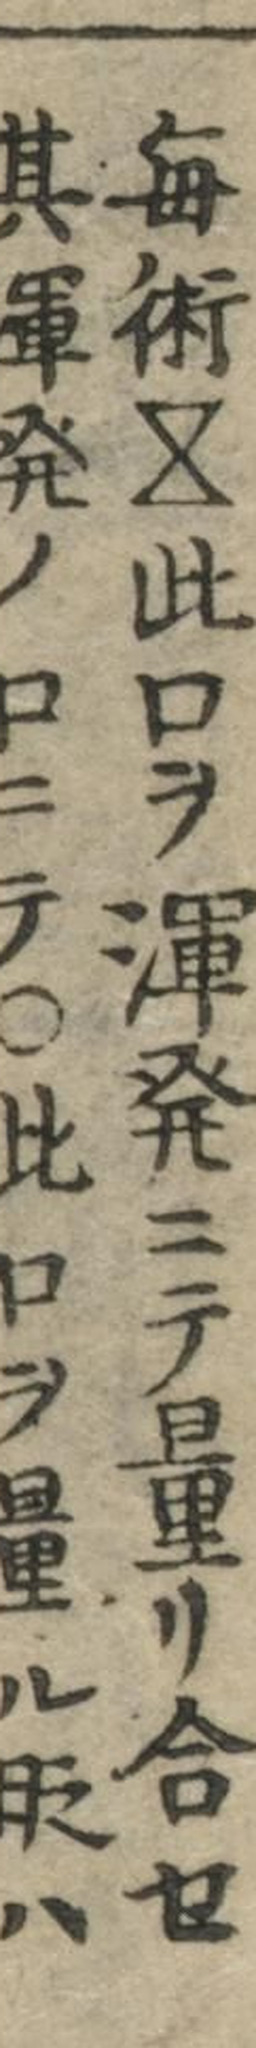其渾発ノ口ニテ○此口ヲ量ル所？ハ
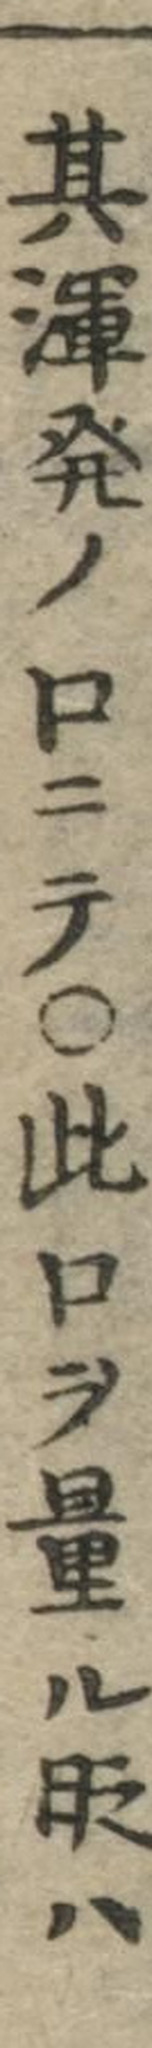其渾発ノ口ニテ○此口ヲ量ル所？ハ
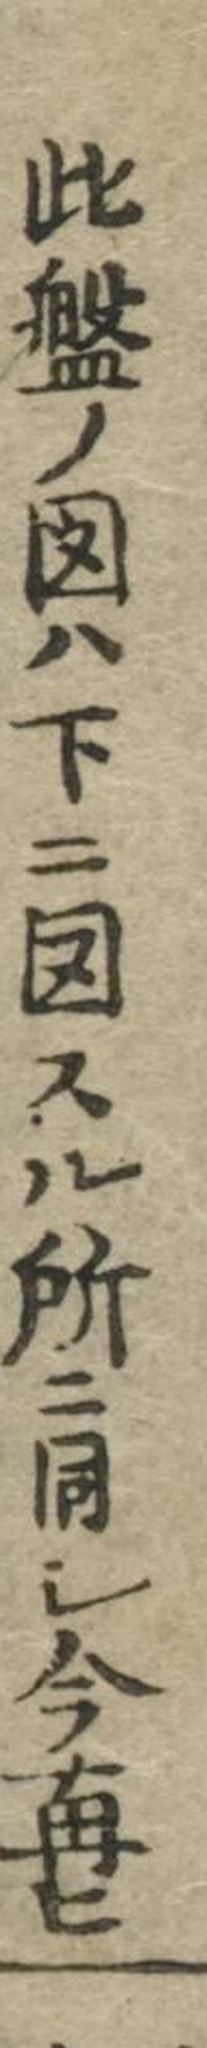此盤ノ図ハ下ニ図スル所ニ同シ今再ヒ
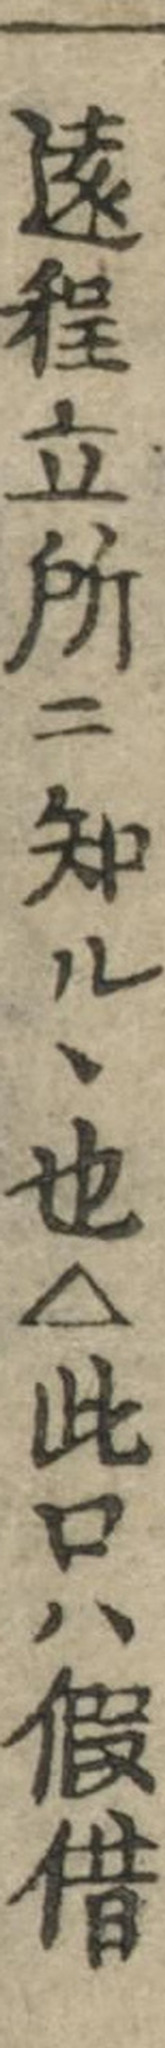遠程立所ニ知ルヽ也△此口ハ仮借
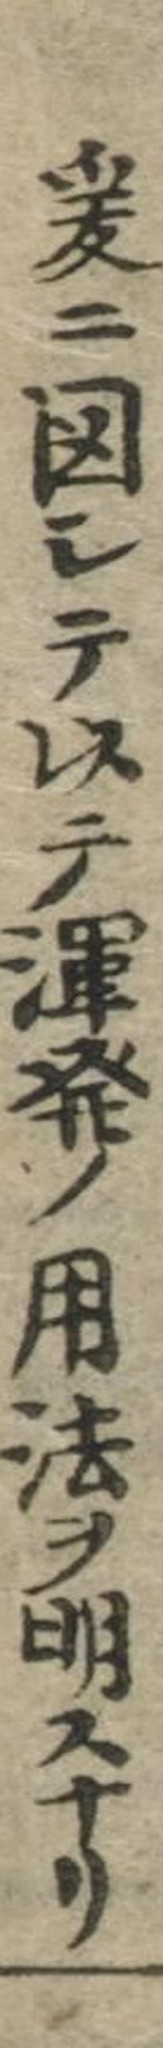爰ニ図シテ以テ渾発ノ用法ヲ明スナリ
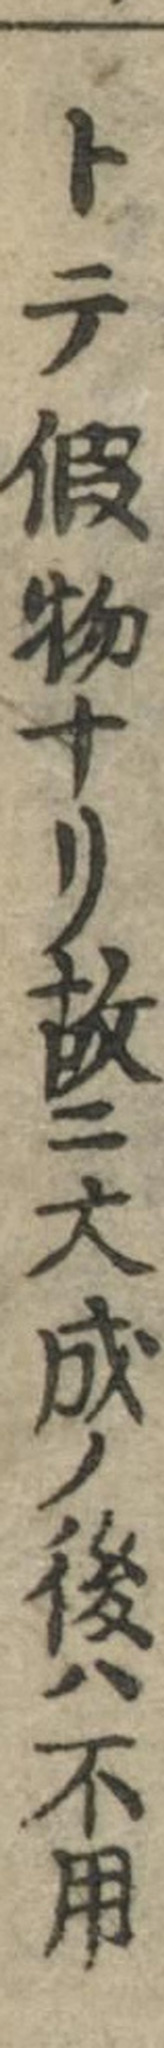トテ仮物ナリ故ニ大成ノ後ハ不用

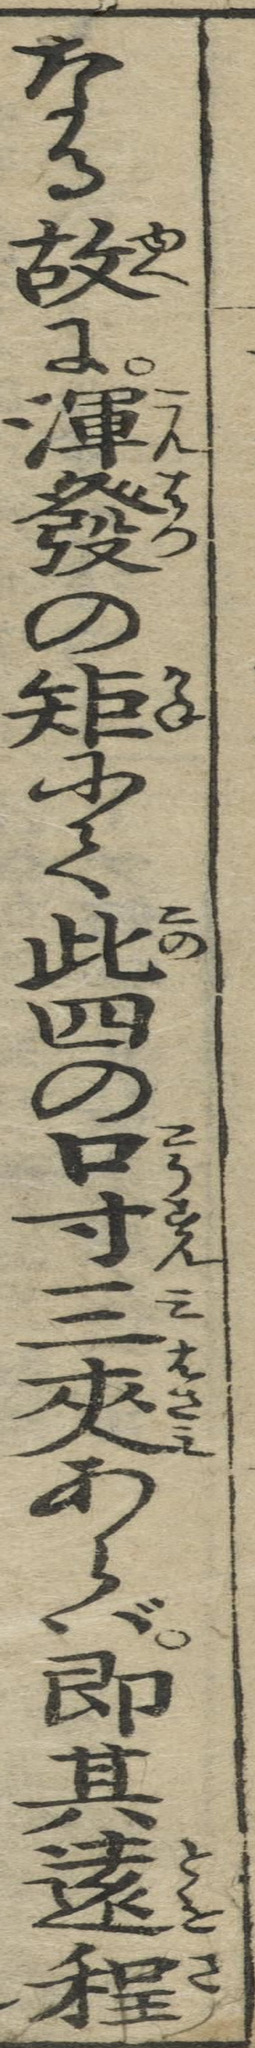なる故に。渾発の矩にて此口寸三夾あらば。即其遠程
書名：量地指南　巻之一（内題）
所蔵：東京大学地震研究所図書室 Earthquake Research Institute Library, The University of Tokyo, JAPAN
